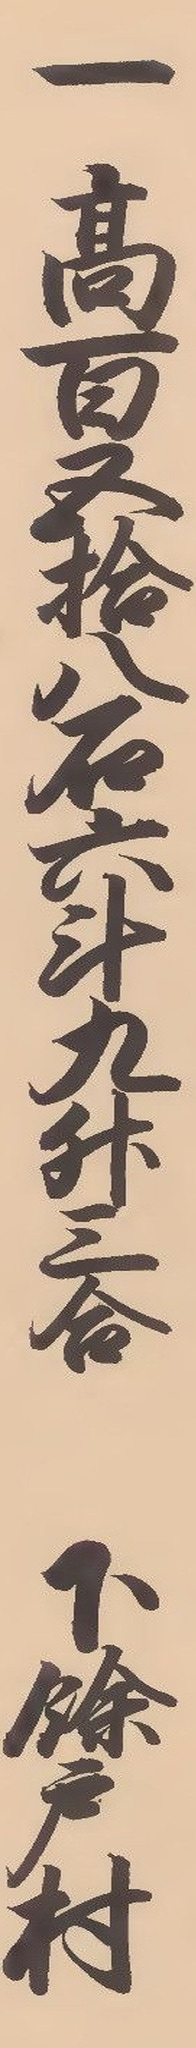一高百五拾八石六斗九升三合下余戸村
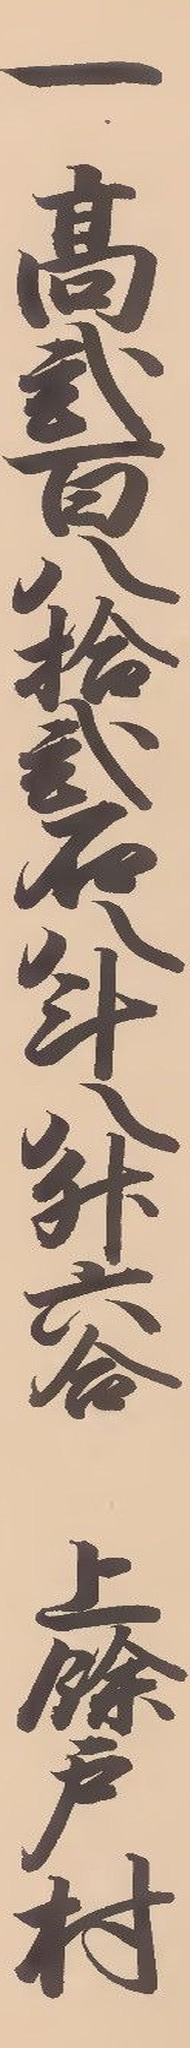一高弐百八拾弐石八斗八升六合上余戸村
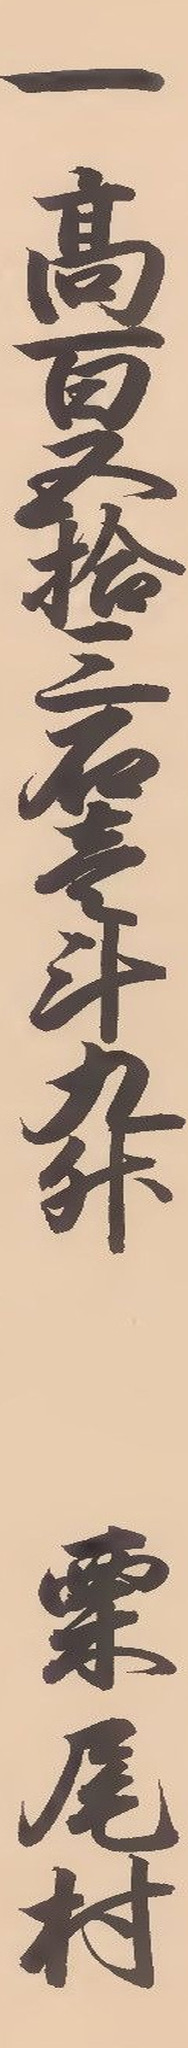一高百五拾三石壱斗九升栗尾村
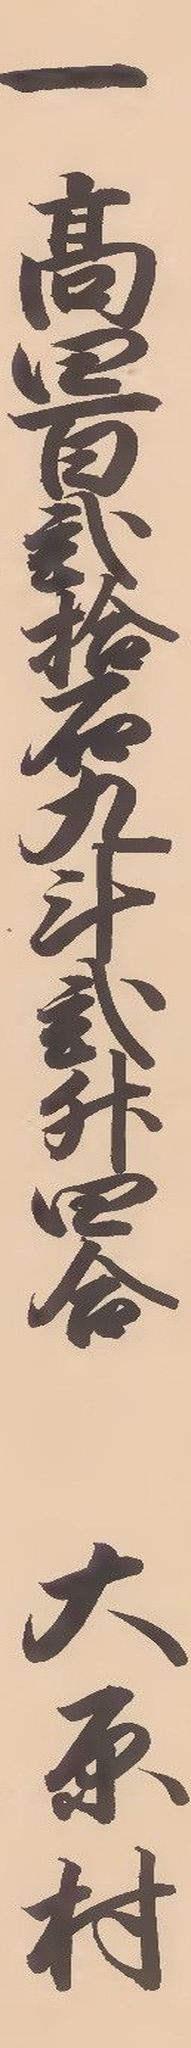一高四百弐拾石九斗弐升四合大原村
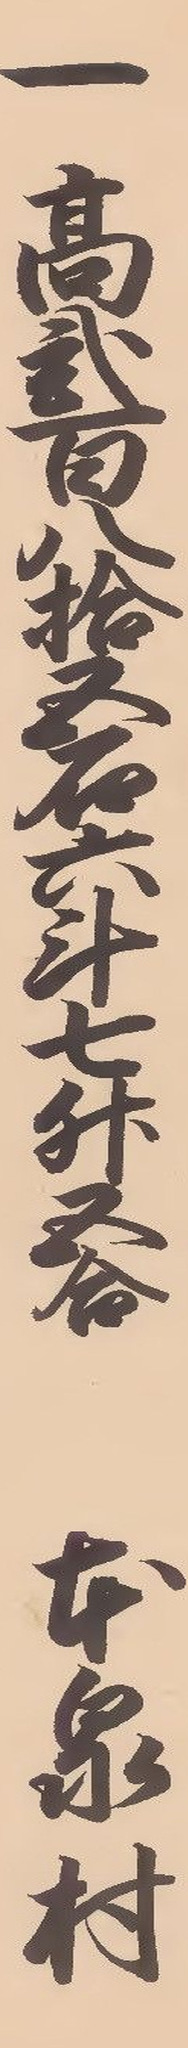一高弐百八拾五石六斗七升五合本泉村

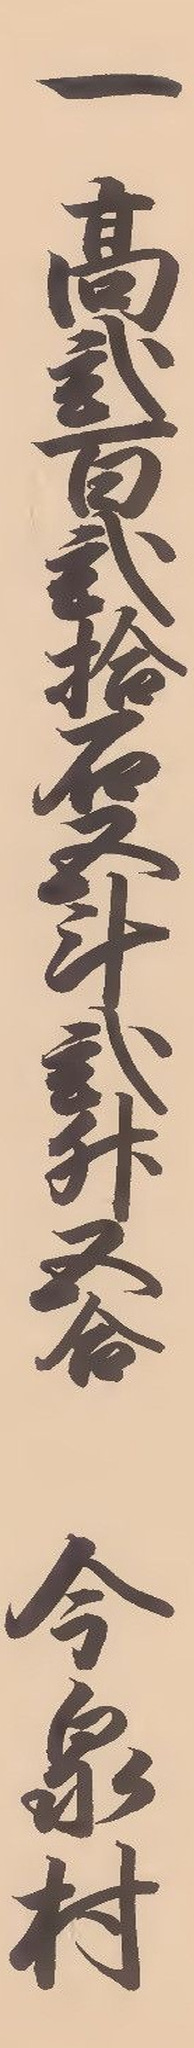一高弐百弐拾石五斗弐升五合今泉村
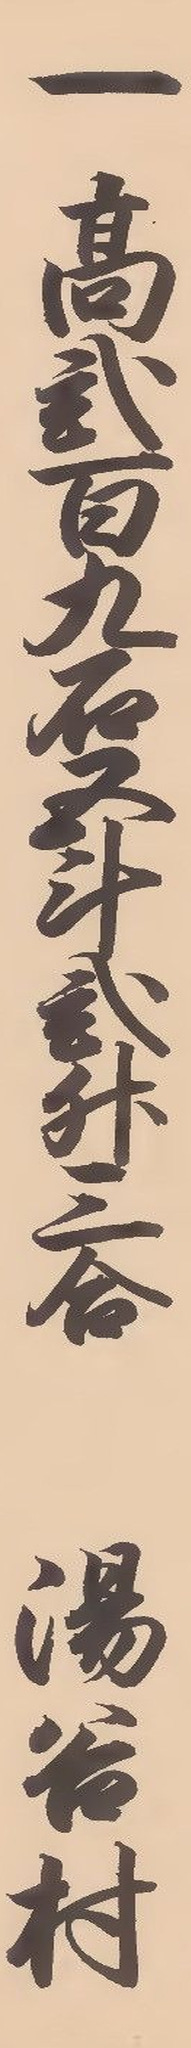一高弐百九石五斗弐升三合湯谷村
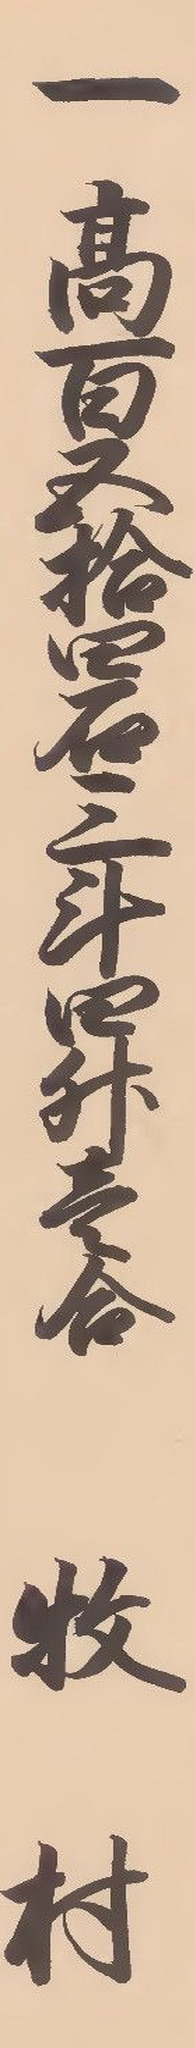一高百五拾四石三斗四升壱合枚村
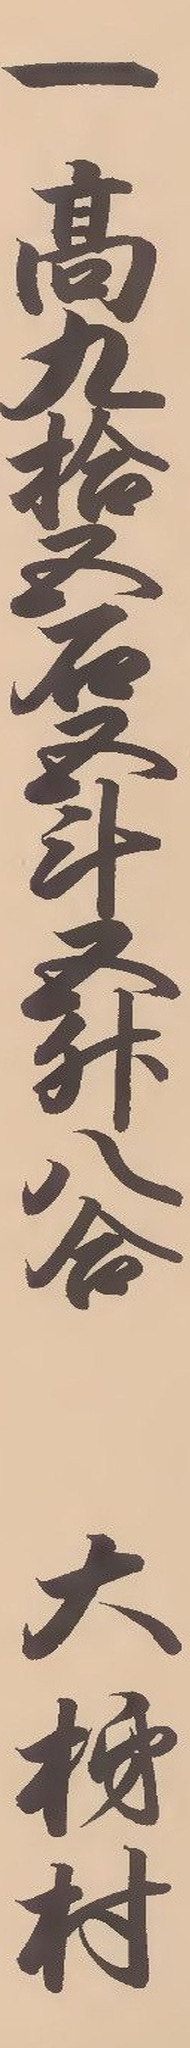一高九拾五石五斗五升八合大柿村
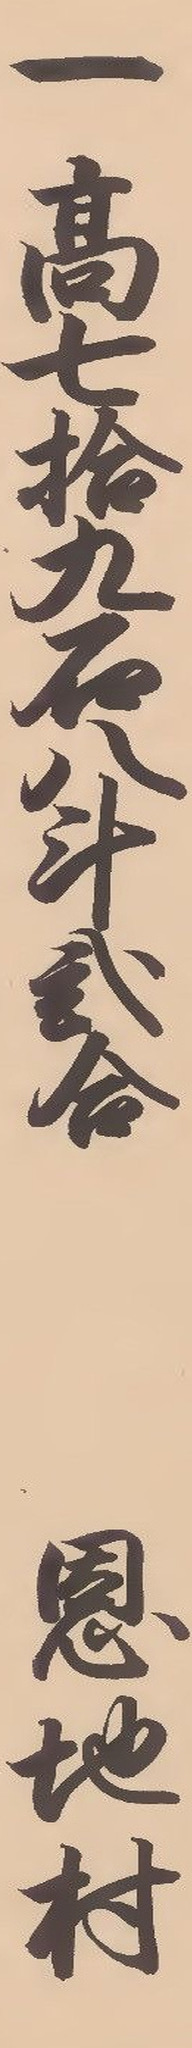一高七拾九石八斗弐合恩地村
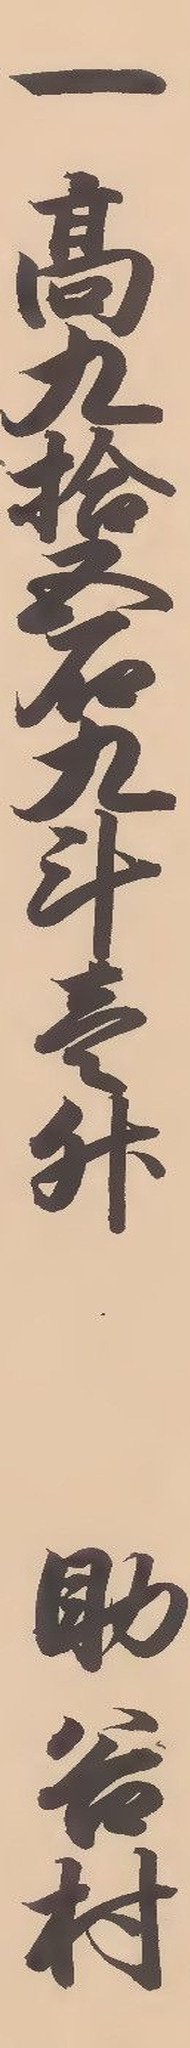一高九拾五石九斗壱升助谷村
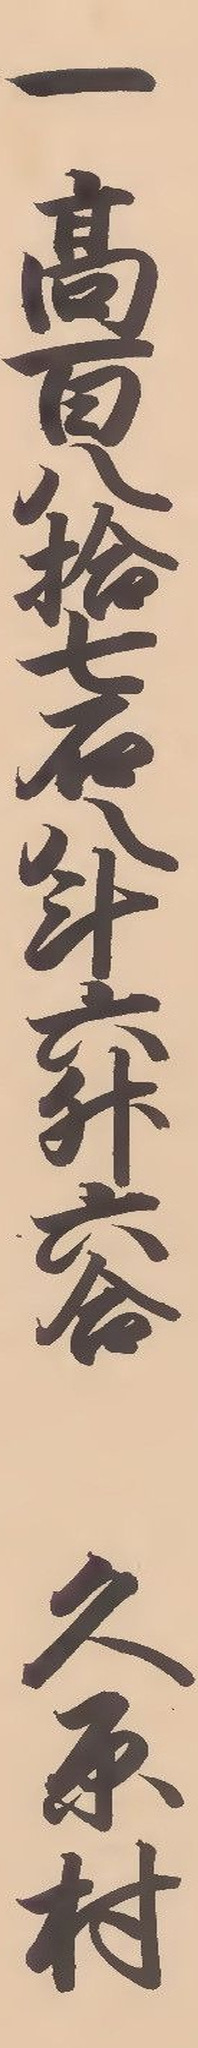一高百八拾七石八斗六升六合久原村

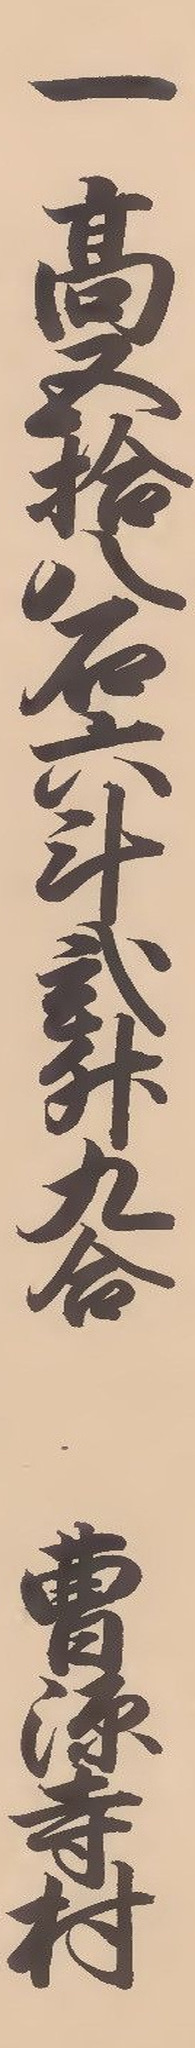一高五拾八石六斗弐升九合曹源寺村
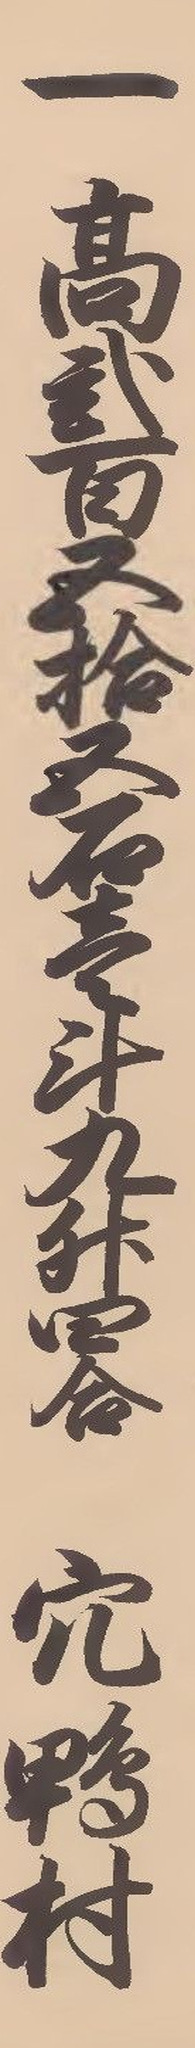一高弐百五拾五石壱斗九升四合穴鴨村
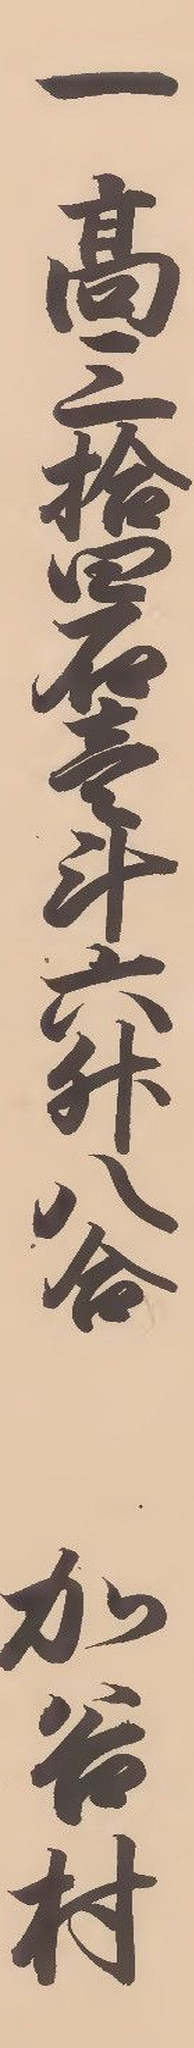一高三拾四石壱斗六升八合加谷村
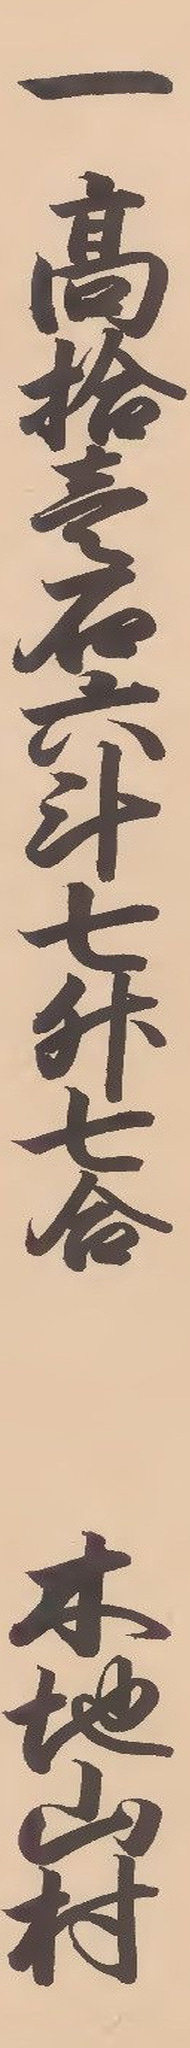一高拾壱石六斗七升七合木地山村
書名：伯耆国郷帳
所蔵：国立公文書館 National Archives of Japan
